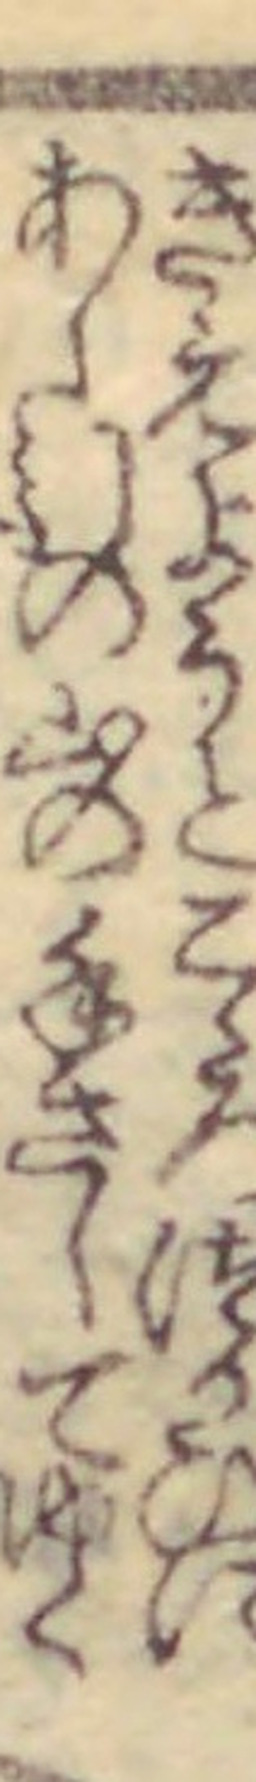あし引の山の手さしてゆく
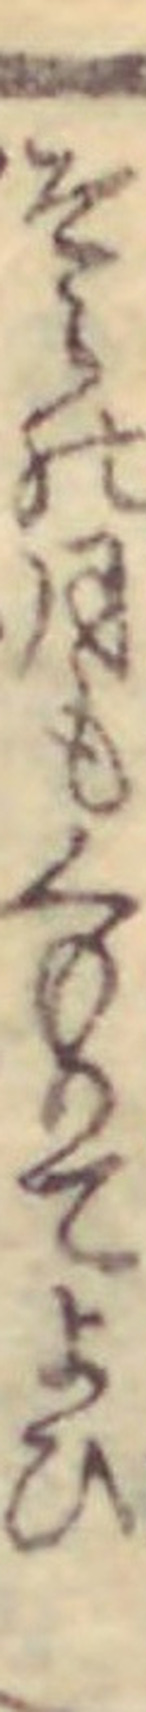そらの月もくもりてよひ
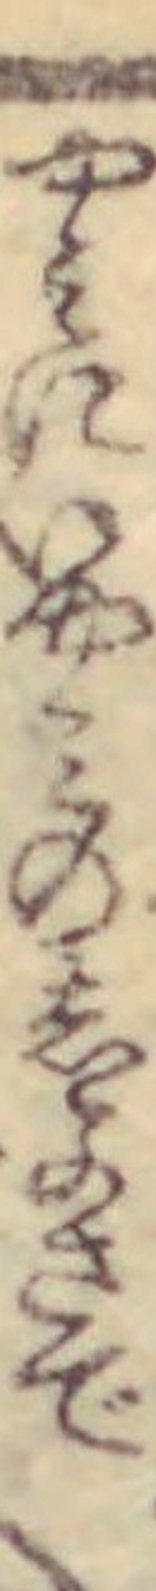やみにいまみのしよさで
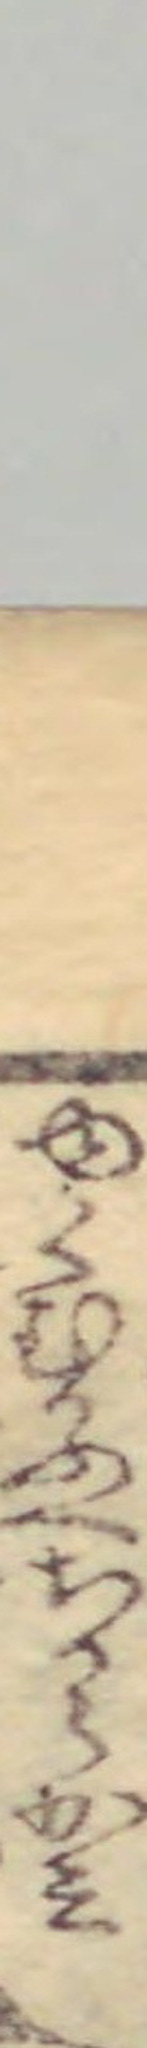ゆくむかふへちからかみ
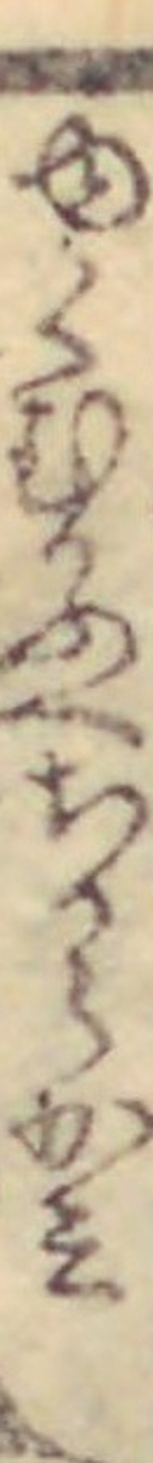ゆくむかふへちからかみ
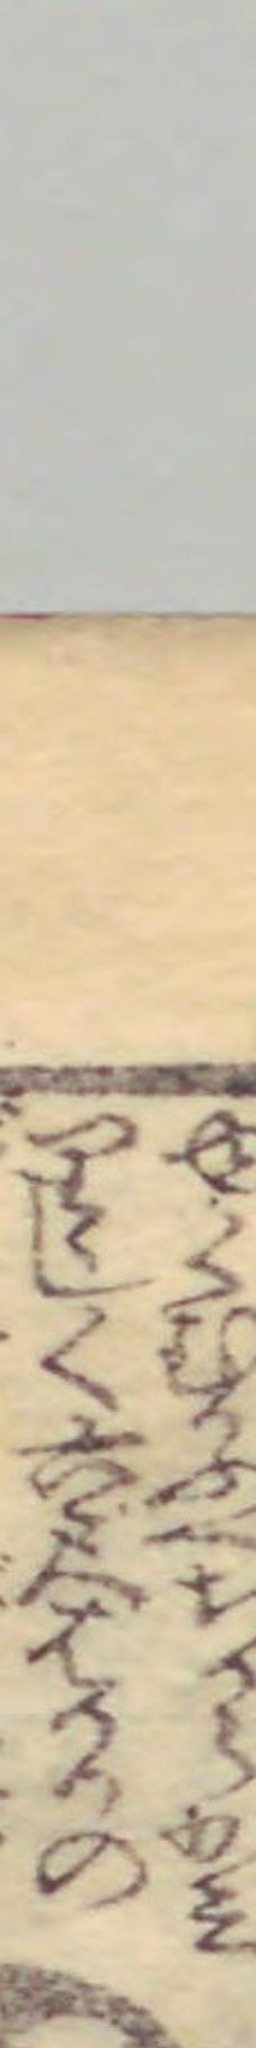りゝしく六尺はかりの
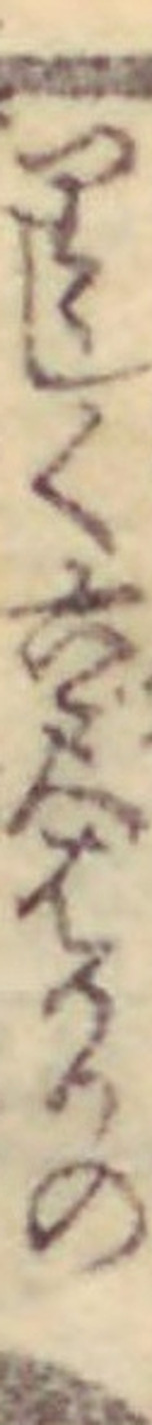りゝしく六尺はかりの
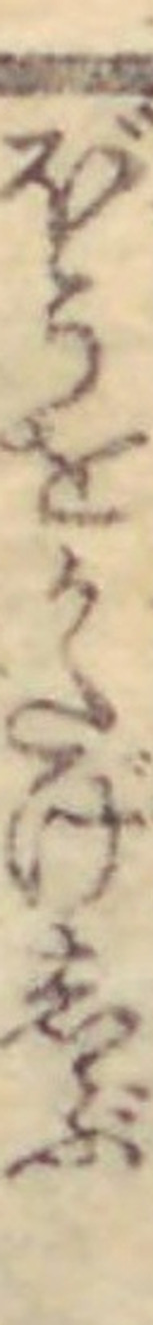ぼうをかたげしぶ
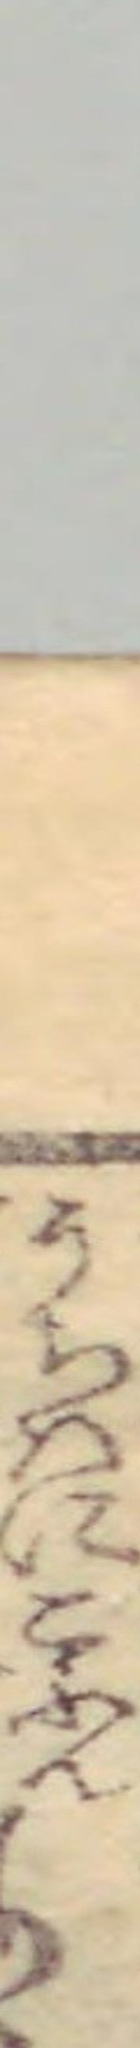うちはにごふん
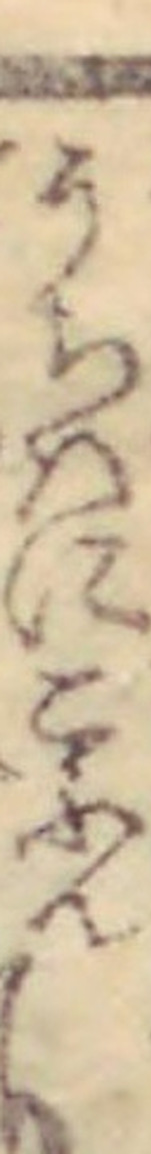うちはにごふん
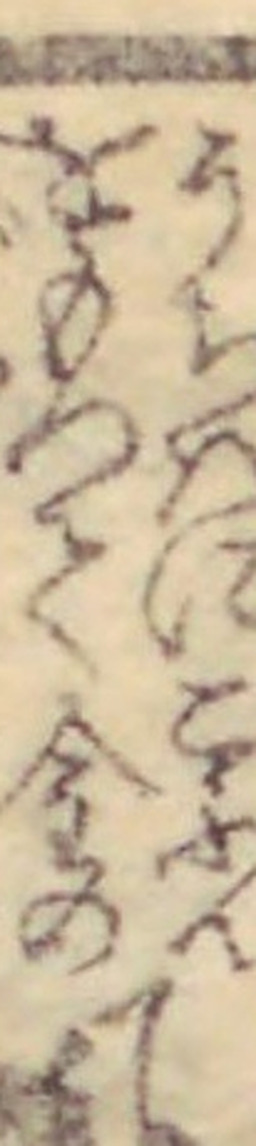をもつて金の
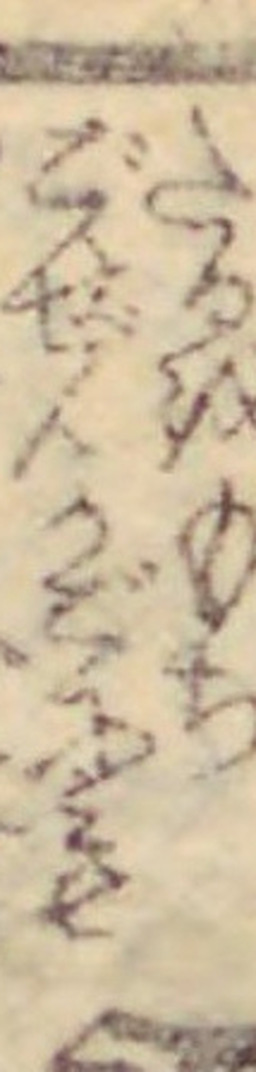ごんぜんかごにも
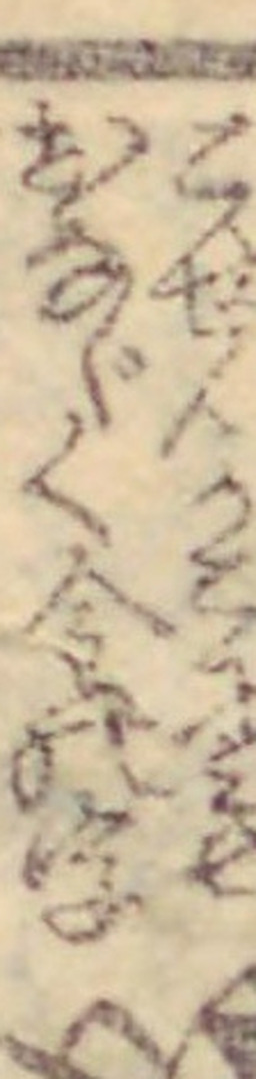おなじく金の字
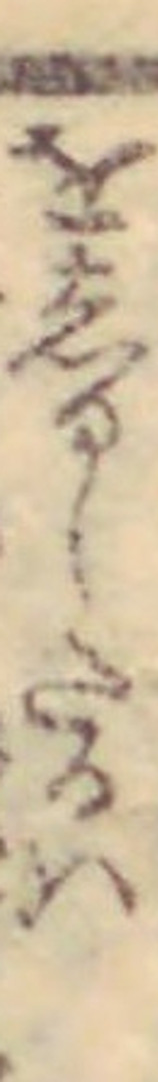をしるしたるは
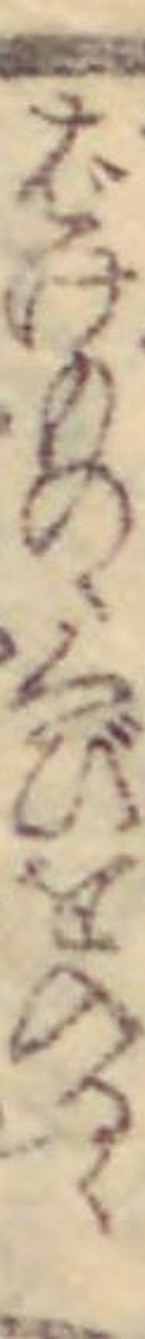ばけものゝくびを入るゝ
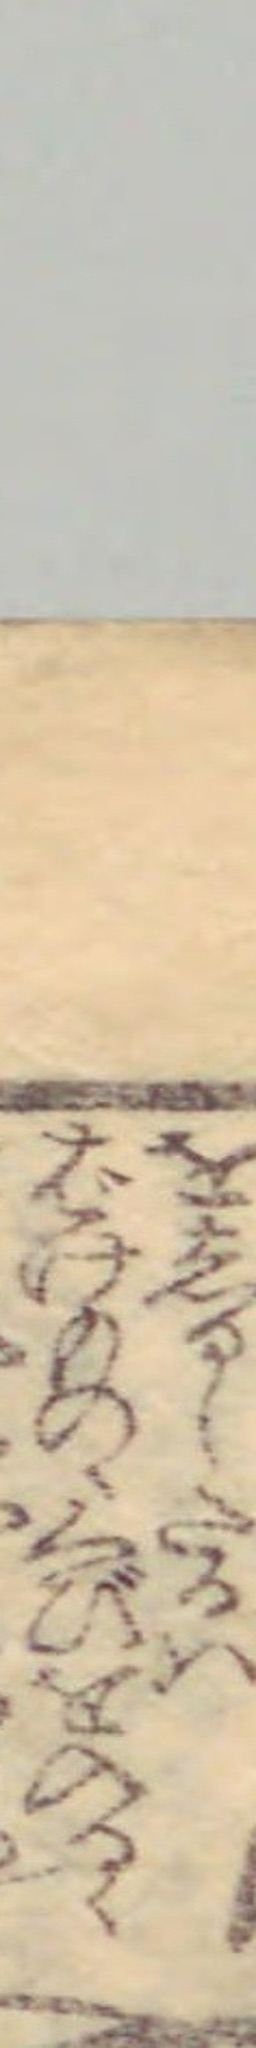ばけものゝくびを入るゝ
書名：化物世帯氣質
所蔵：国立国会図書館 National Diet Library, JAPAN
